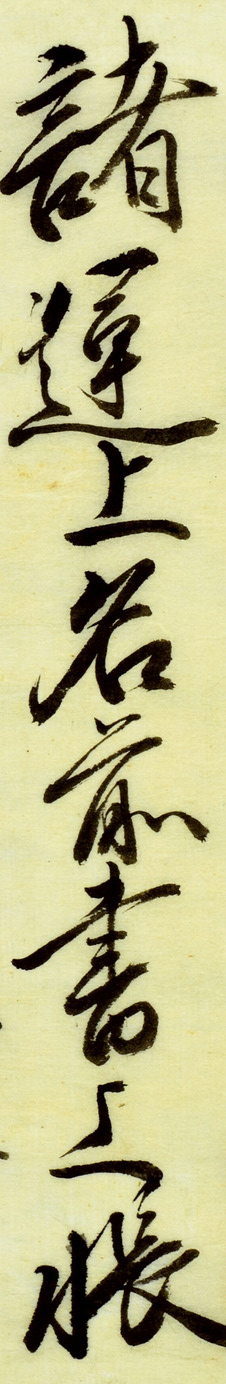諸運上名前書上帳
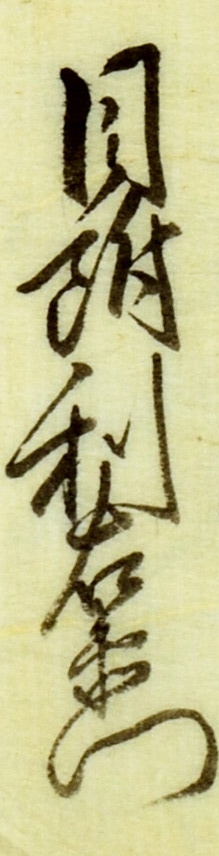目附利右衛門
